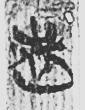老
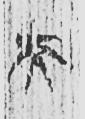夫
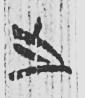之
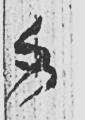力
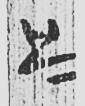也
